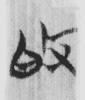敀
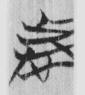者
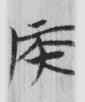侯
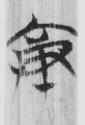{亯京}
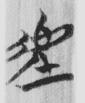𫊟
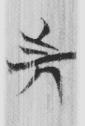先
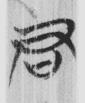君
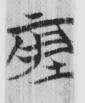坪
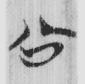公
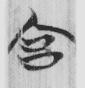宫
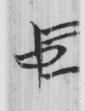𠁩
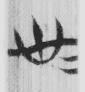卅=
